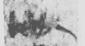卌
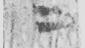二
